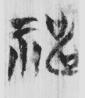神
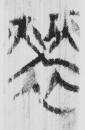勞
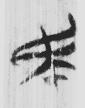民
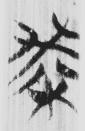楑
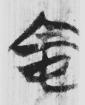{宀𠁩}
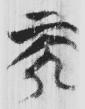而
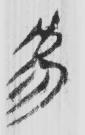象
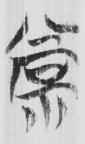常
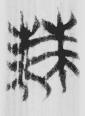𣗥
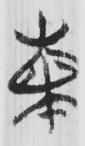柬
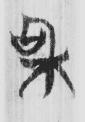和
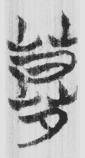{莫夕}
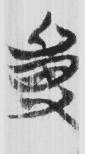尃
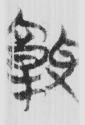{享夬}
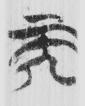而
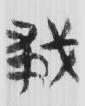救
